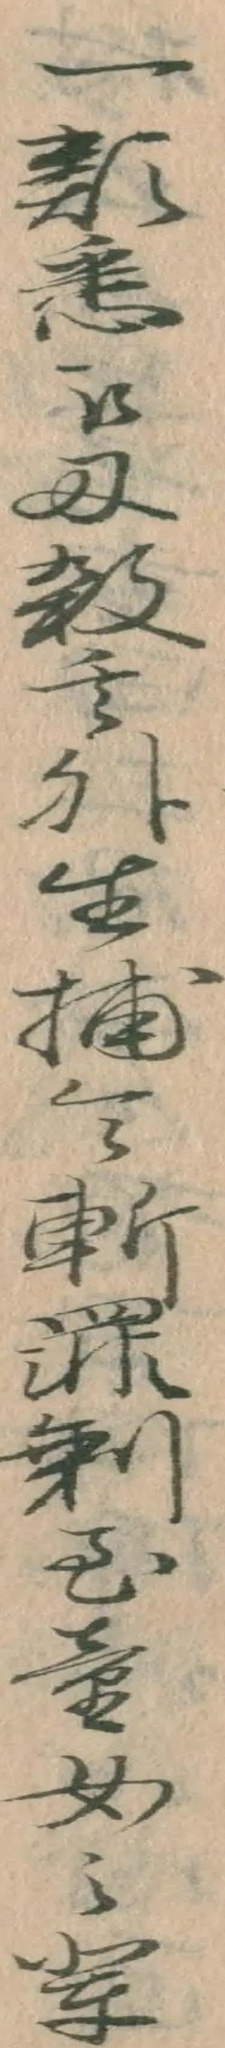一類悉被刃殺其外生捕令斬罪剰至童女之輩
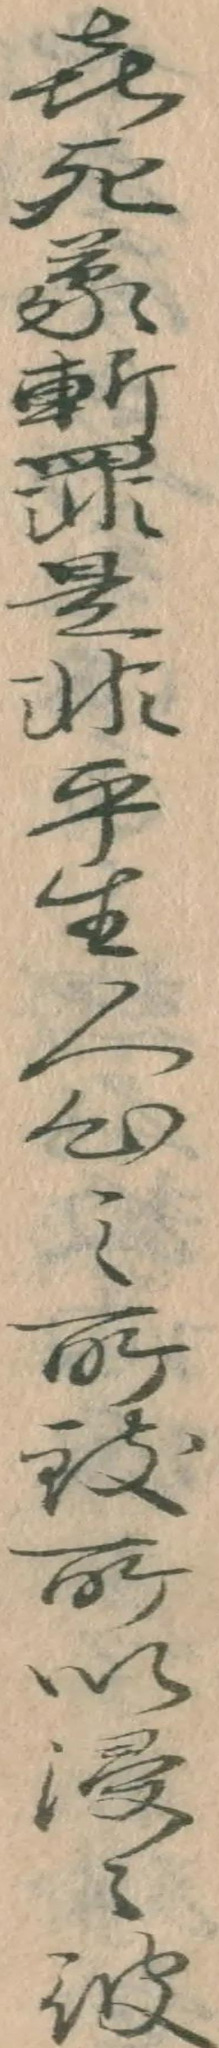喜死承斬罪是非平生人心之所致所以浸々彼
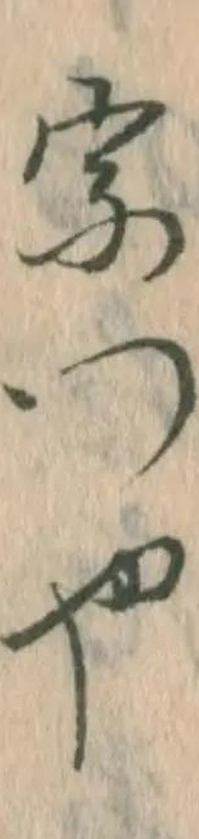宗門也
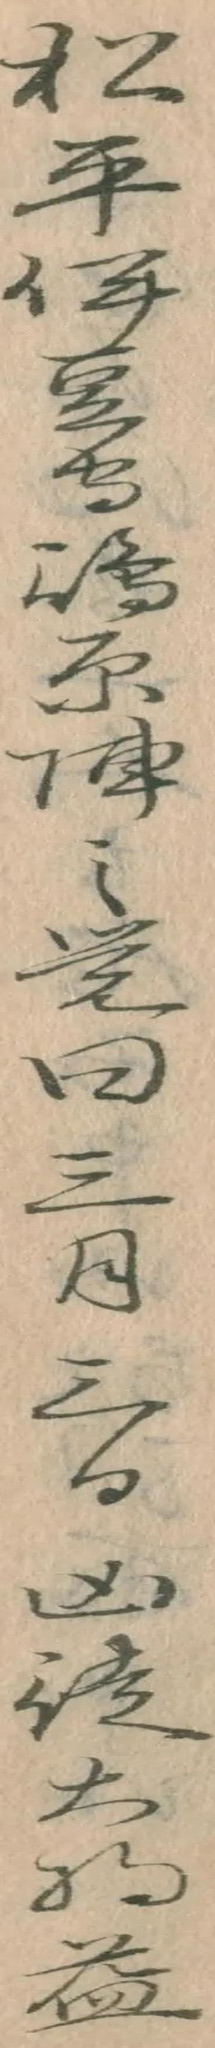松平伊豆守島原陣之覚曰三月三日凶徒大将益
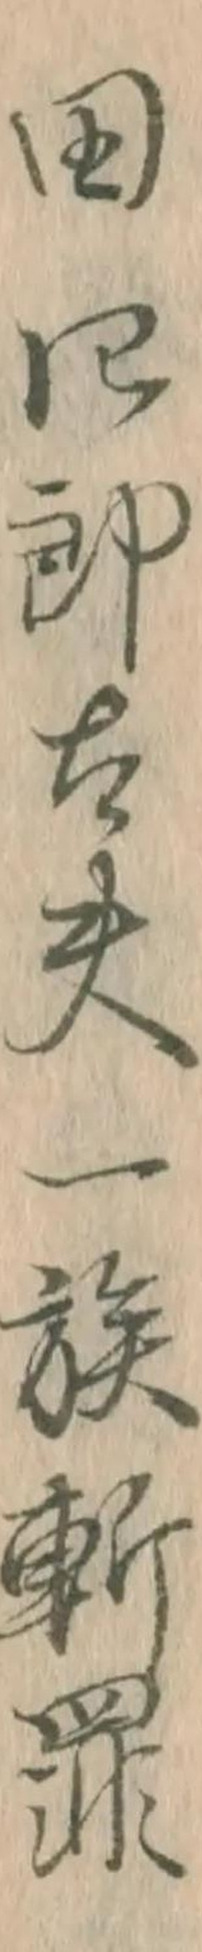田四郎太夫一族斬罪
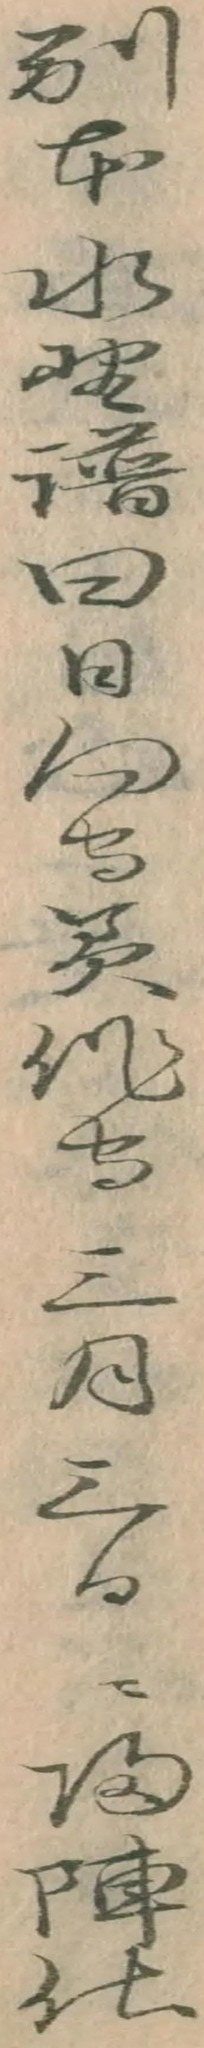別本水野譜曰日向守美作守三月三日に帰陣仕

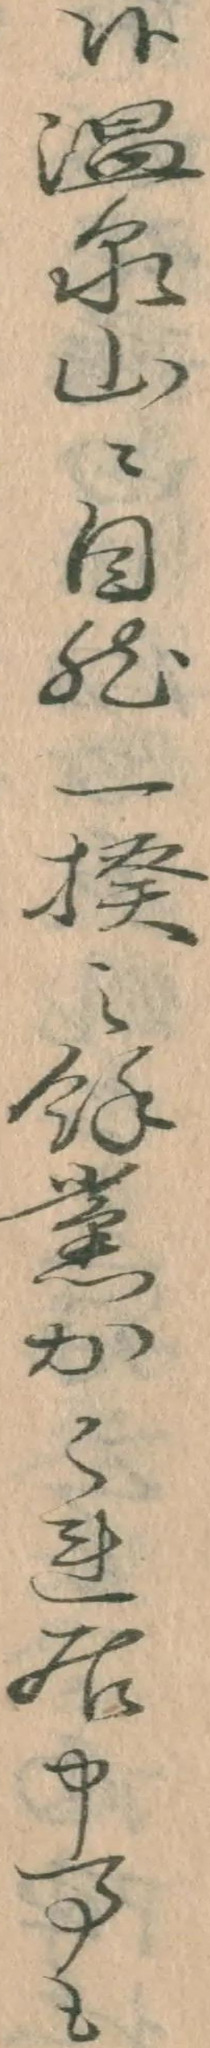候温泉山に自然一揆之余党かく連居申事も
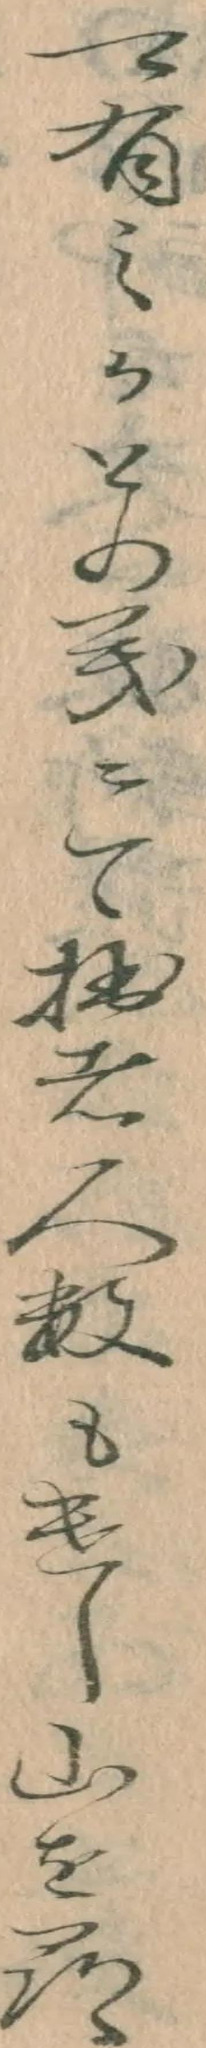可有之かとの義にて拙者人数も遣し山を尋
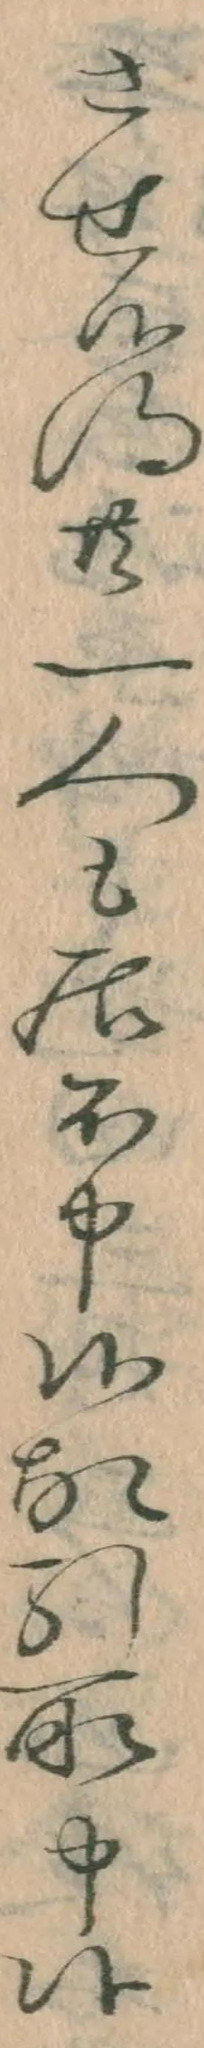させ候得共一人も居不申候故引取申候
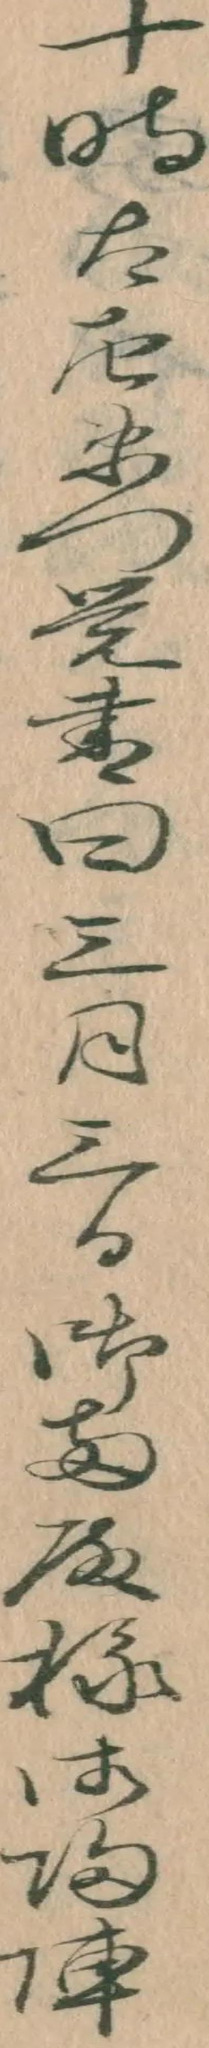十時太左衛門覚書曰三月三日御両殿様御帰陣
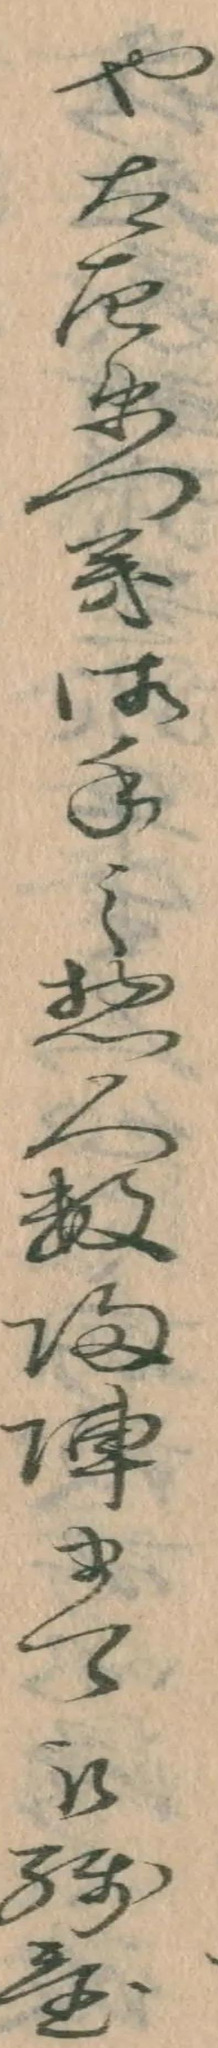也太左衛門義御手之惣人数帰陣まて被残置
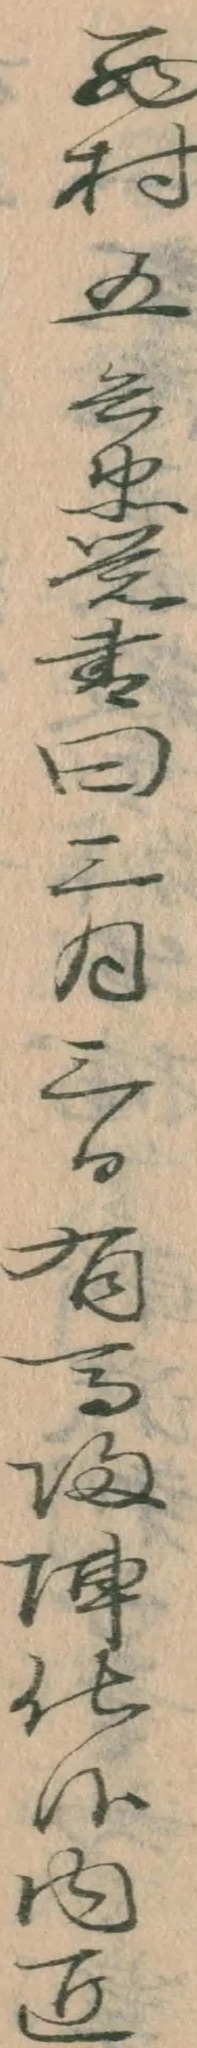西村五兵衛覚書曰三月三日有馬帰陣仕候内匠
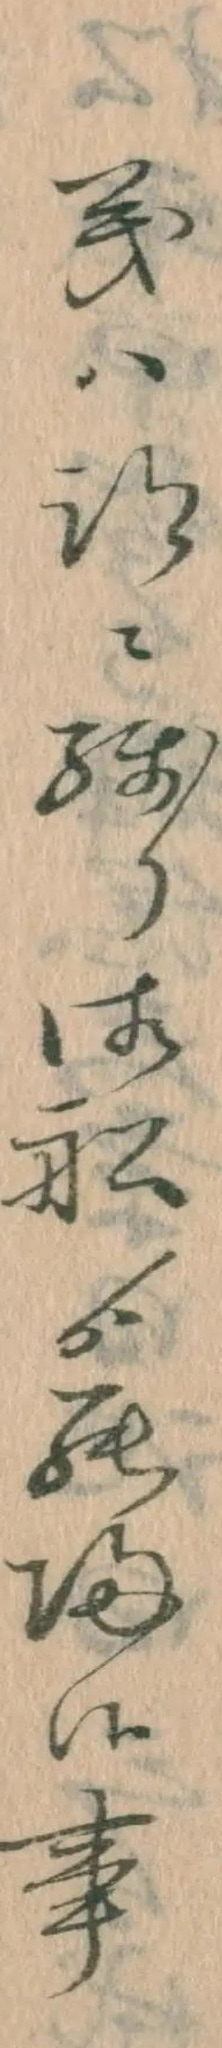義は跡に残り御舩より罷帰候事
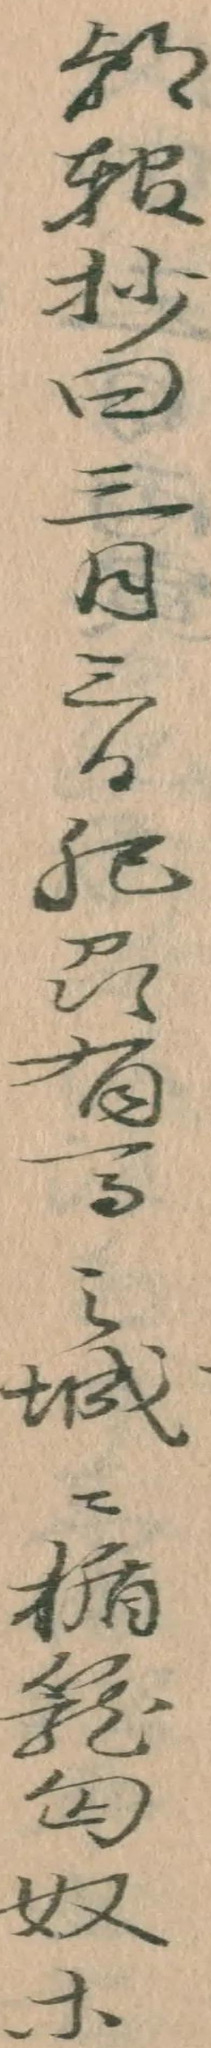朝報抄曰三月三日肥州有馬之城に楯籠匈奴等
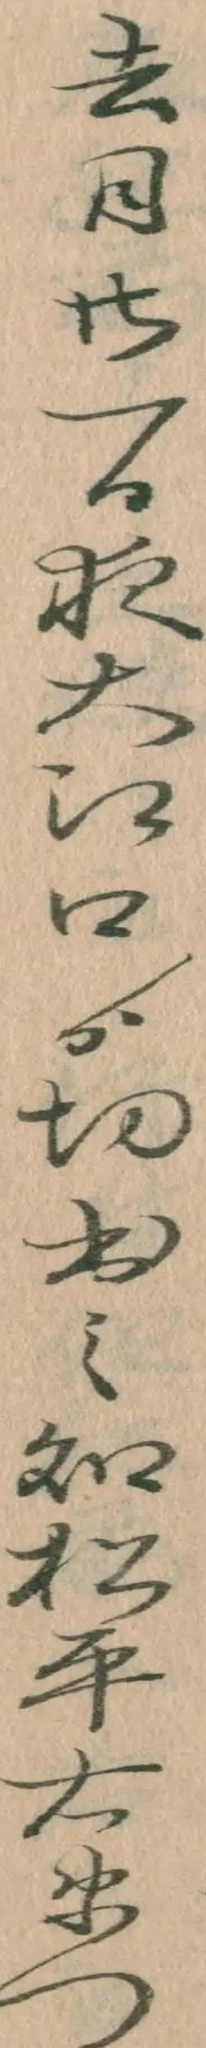去月廿一日夜大江口ゟ切出之処松平右衛門
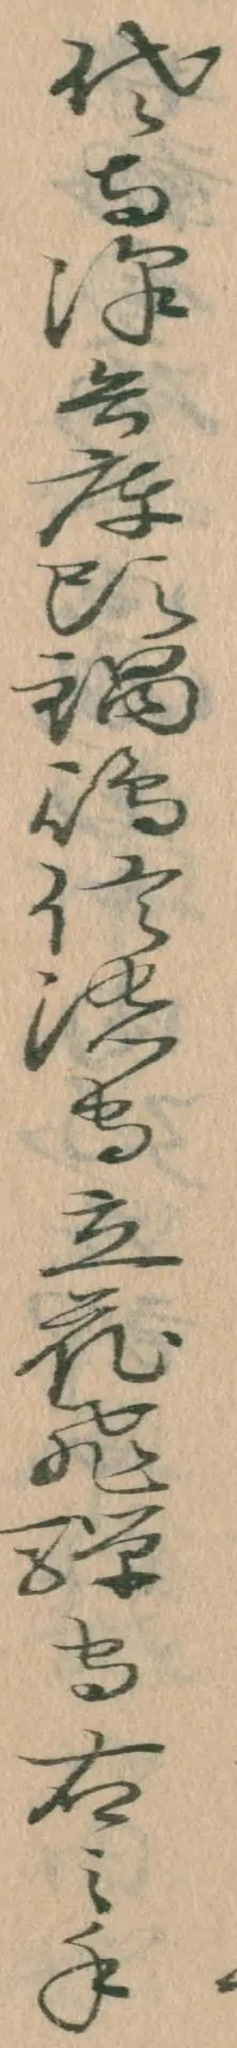佐寺沢兵庫頭鍋島信濃守立花飛騨守右之手
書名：切支丹御退治記 49巻. [9]
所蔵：国立国会図書館 National Diet Library, JAPAN
